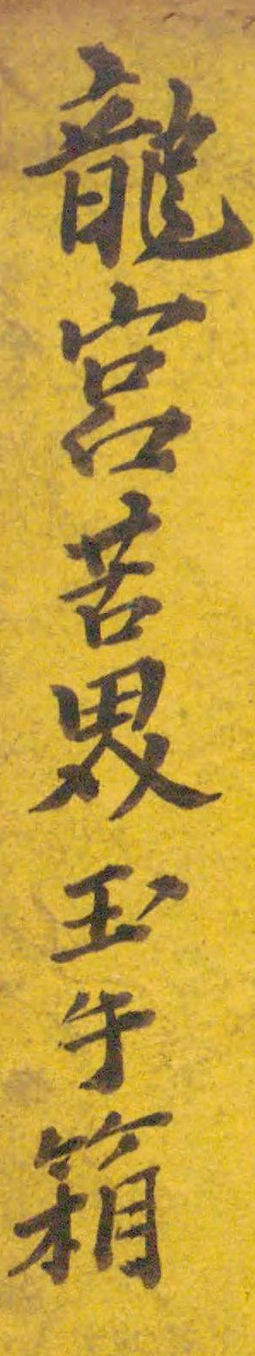竜宮苦界玉手箱

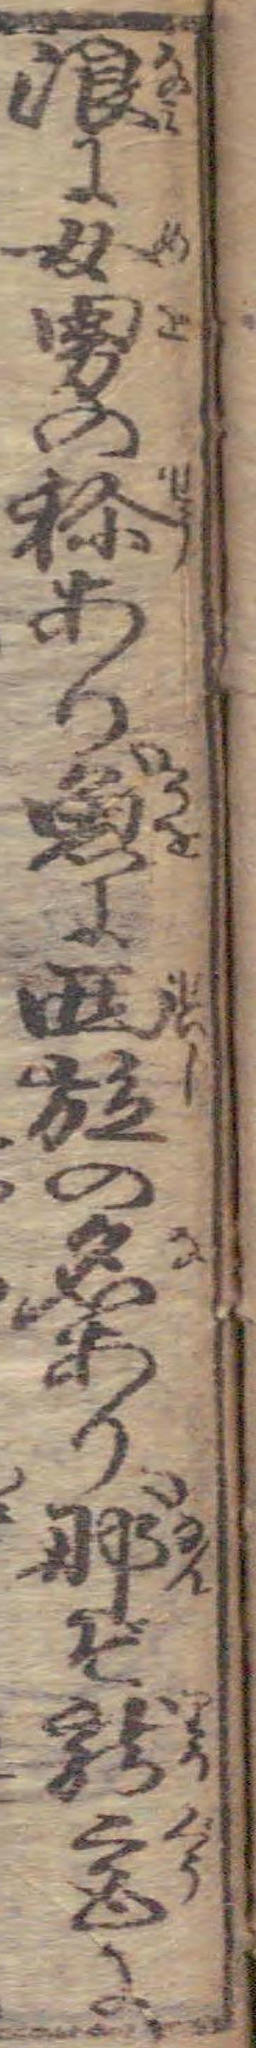浪に女男の称あり。魚に西施の名あり。那ぞ竜宮に
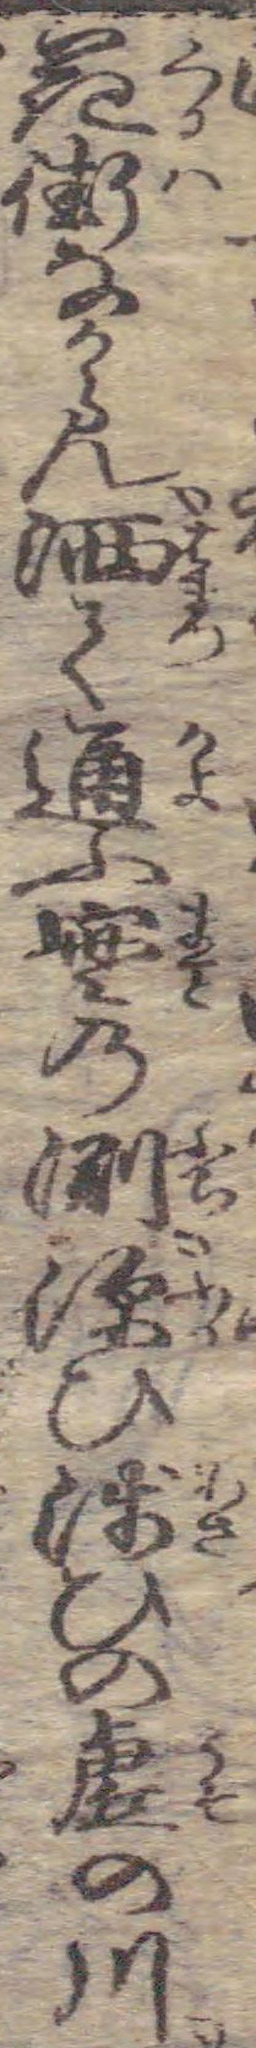花街なからん。酒て通ふ実の渕。深ひ浅ひの虚の川。
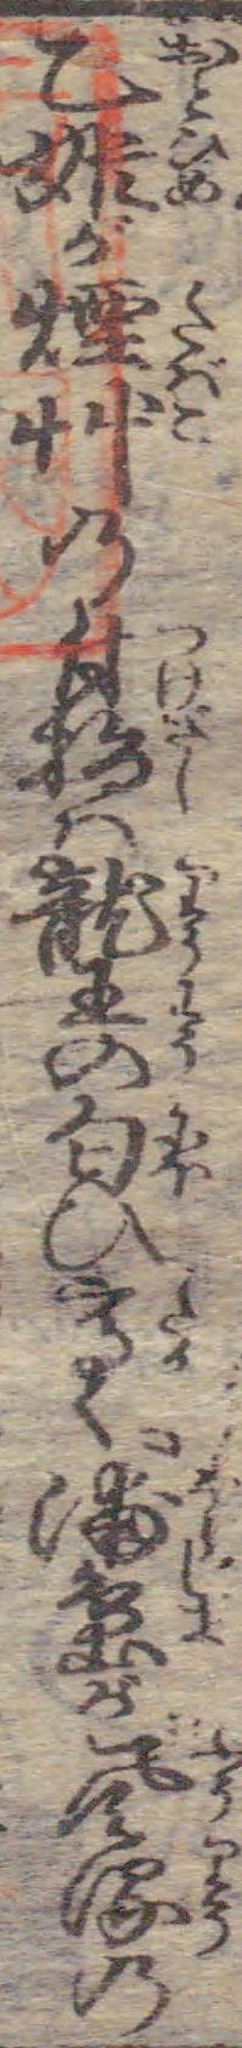乙姫が煙草の付指は竜王の匂ひ高く。浦島が風流の
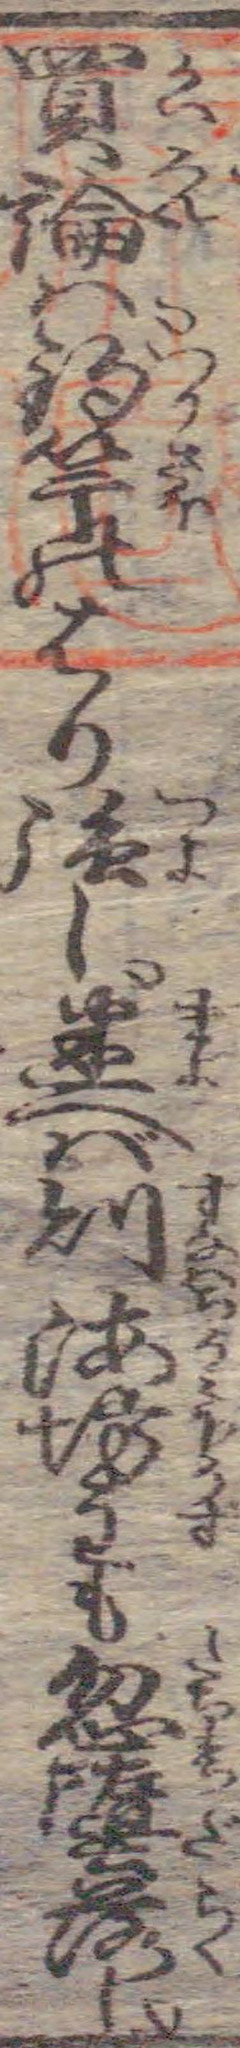買論は。釣竿のはり強し。迷へば則海坊主も忽堕落し。
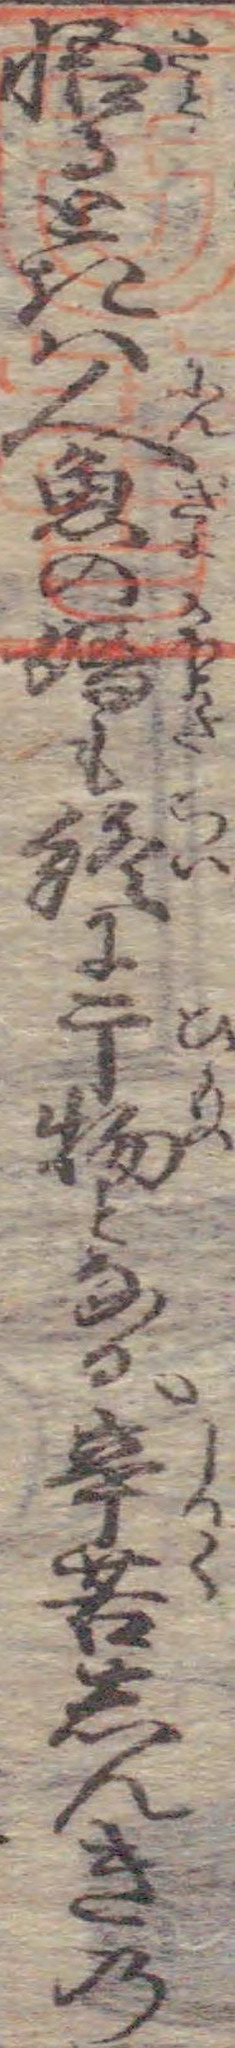悟るときは人魚の嬌も終に干物となる。辛苦しんきの
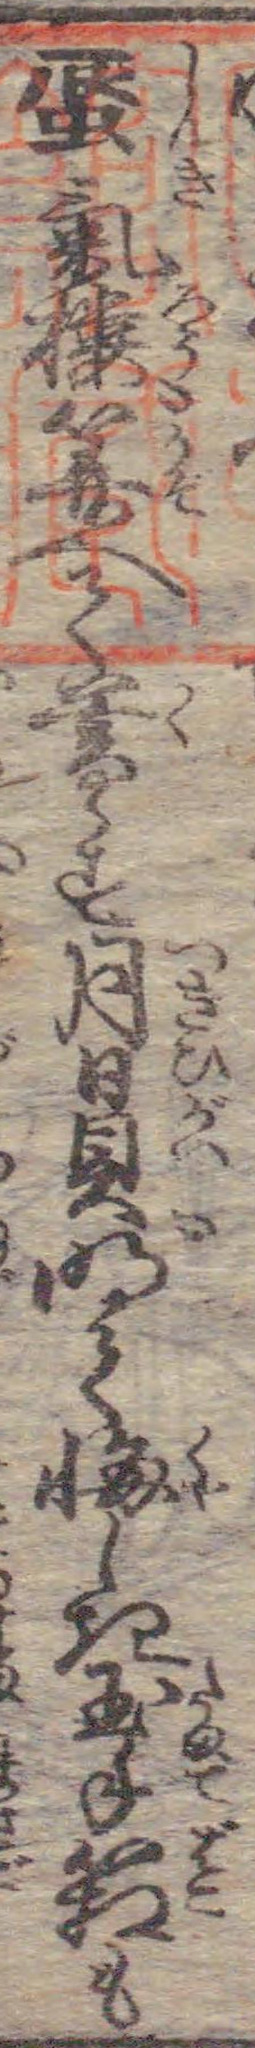蜃気楼。算へて暮らす月日貝。明て悔しき玉手箱も
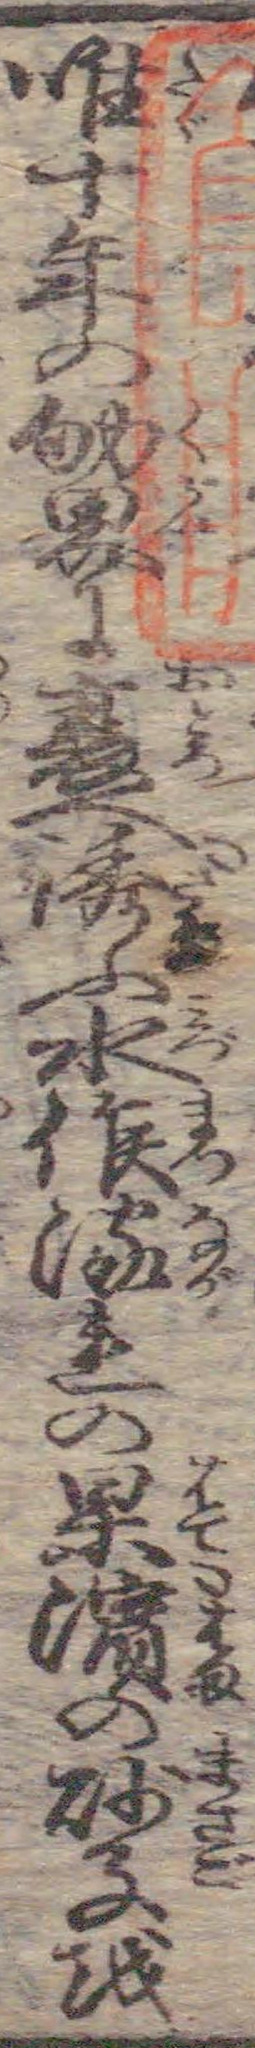唯十年の劬界に衰へ。誘ふ水俟流れの果。浜の砂子を
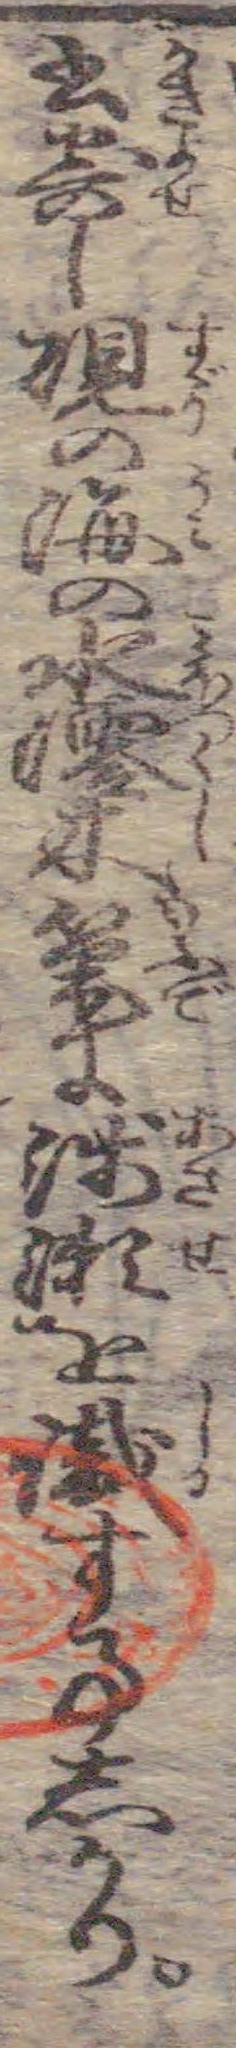書寄し硯の海の水澪木。筆に浅瀬を識す事しかり。
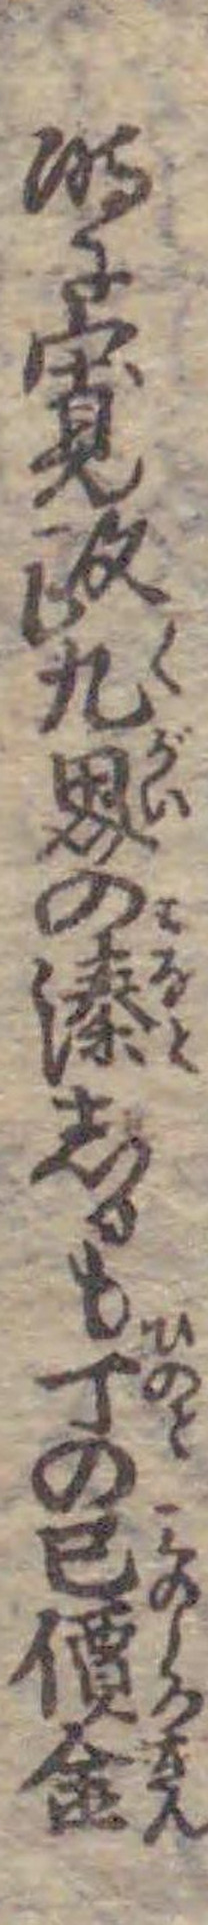時に寛政九界の湊しるも丁の巳価金
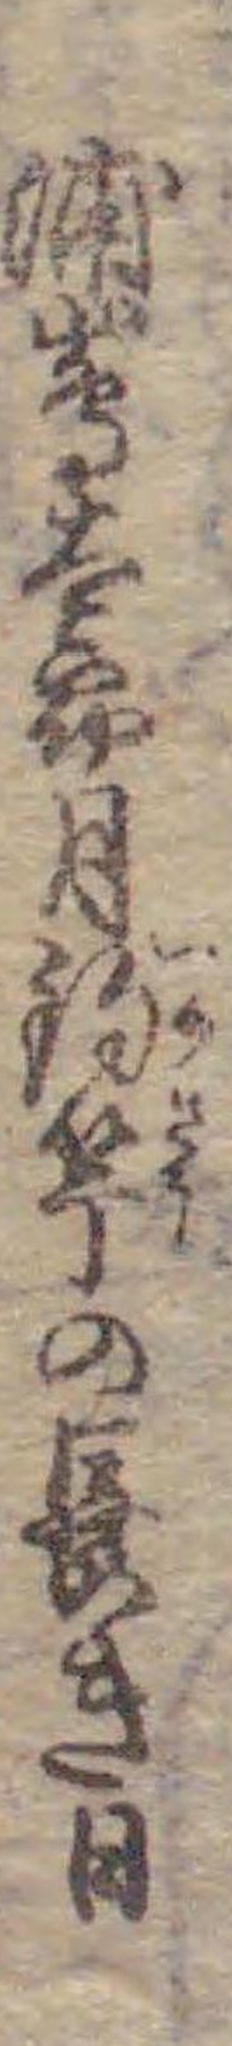浦島太郎月釣竿の長き日
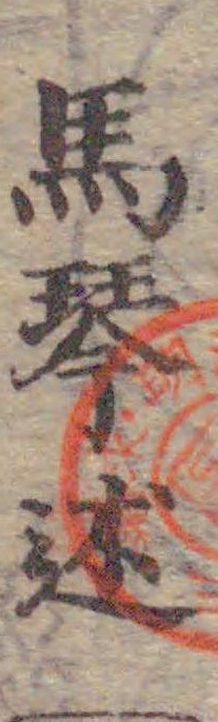馬琴述
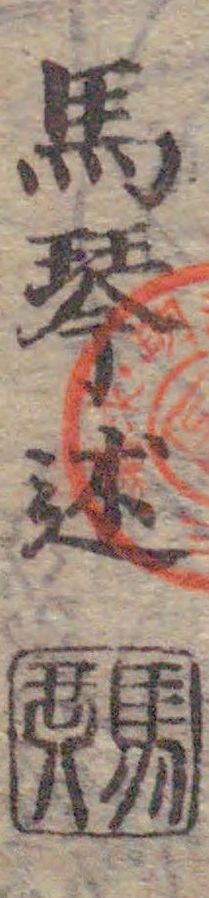馬琴述

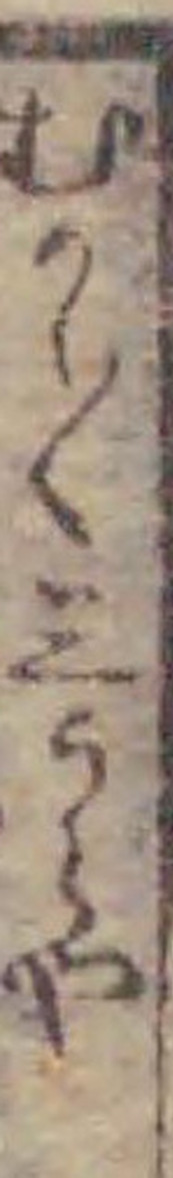むかし〳〵三うらや
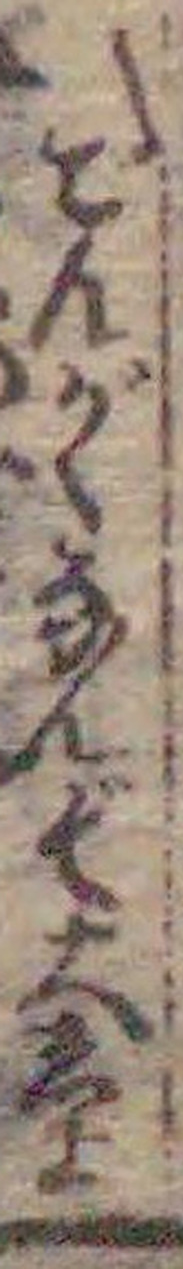〽でんがくなんぞ大しよ
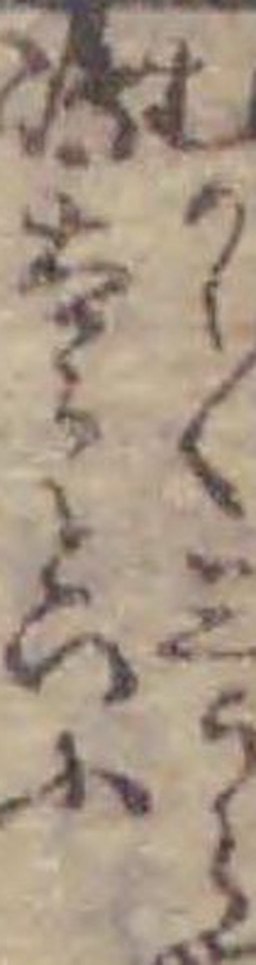島太郎といふ
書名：竜宮苦界玉手箱 : 3巻
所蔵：国立国会図書館 National Diet Library, JAPAN
